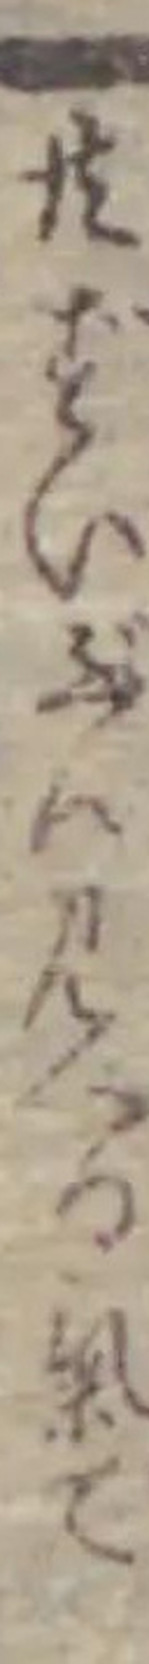共ずいぶん見へる気で
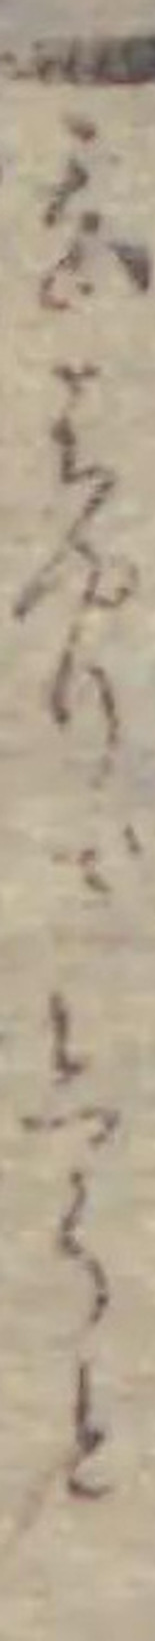甚はやりざとうと
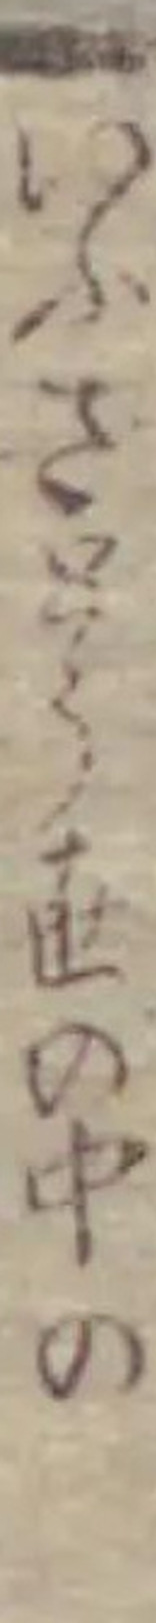いふざとう世の中の
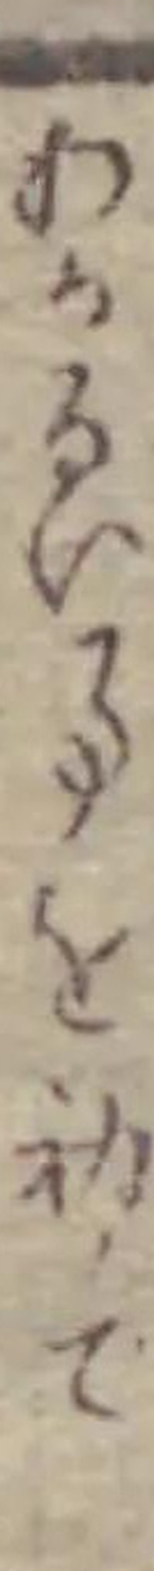あかるい事を初て
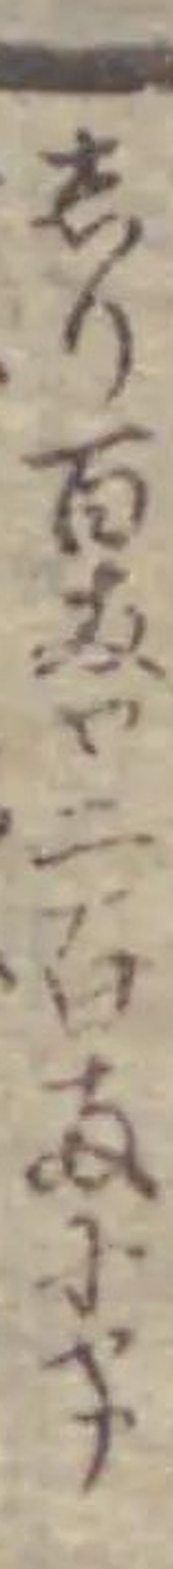しり百両や二百両にャァ
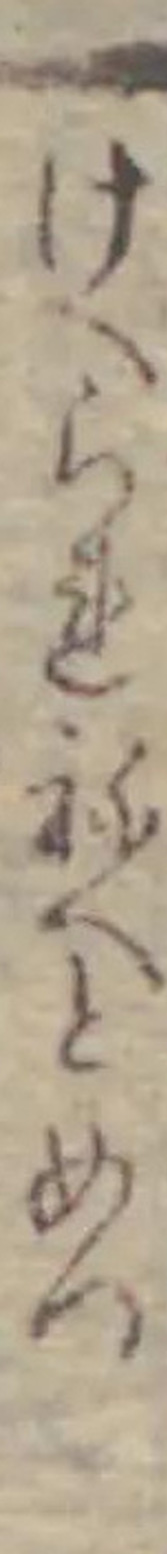けへられねへとめつ
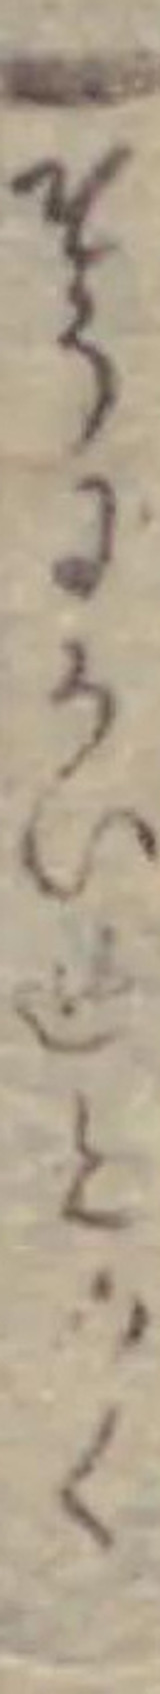そうにかい込とかく
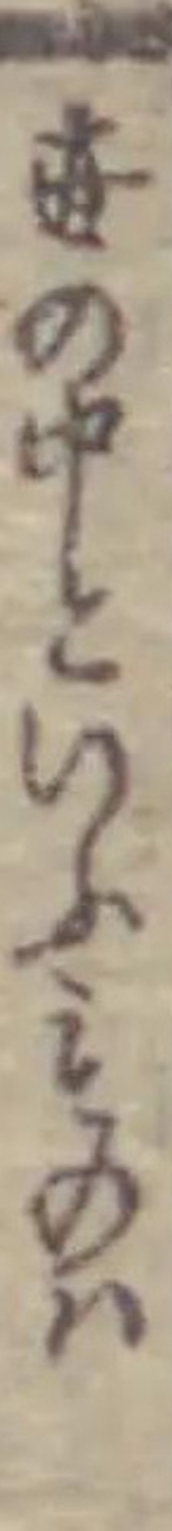世の中といふものは
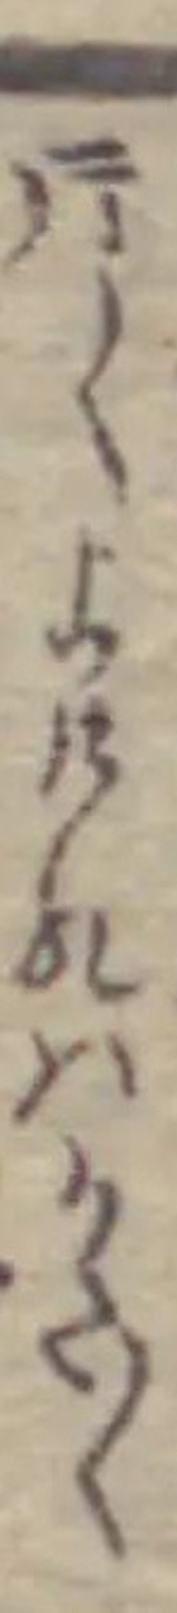片〳〵よけれはかた〳〵
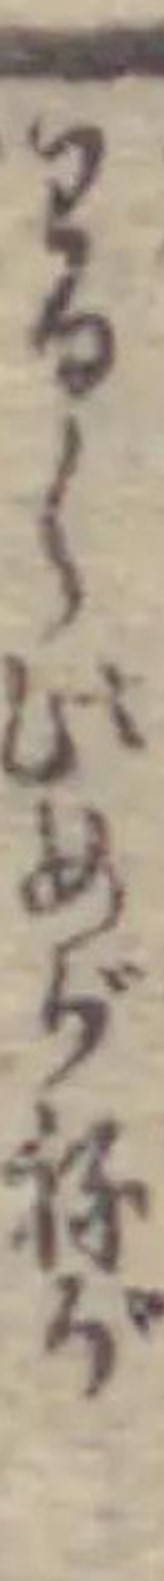わるく此めがねが
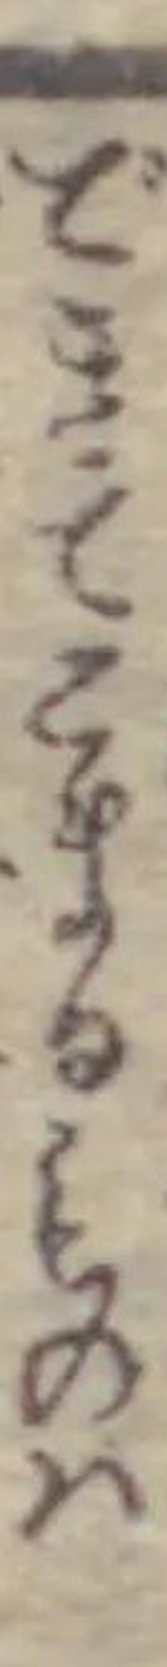できてこまるものは
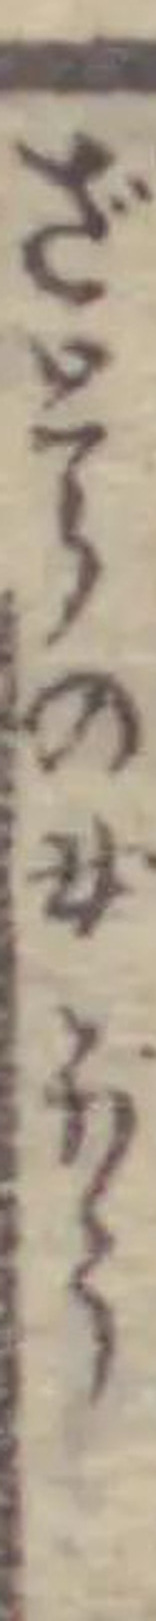ざとうの女ぼう
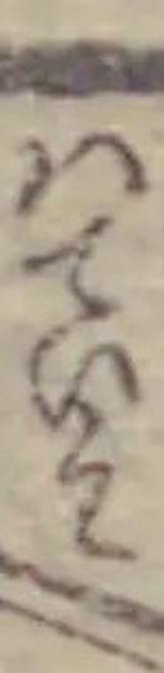はてい主
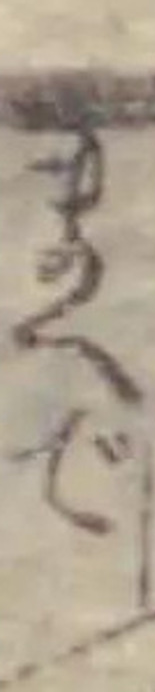まへで
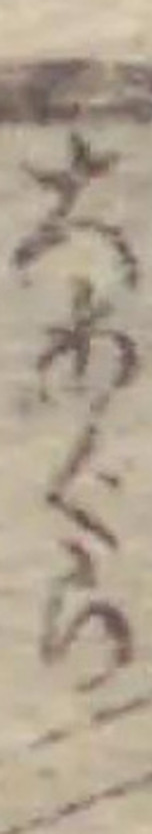大あぐら
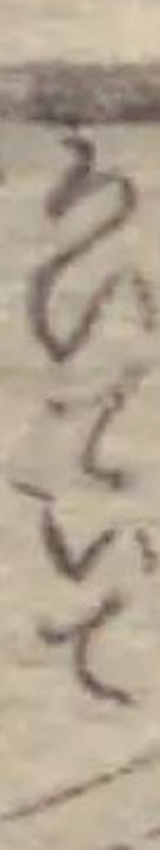かいていて
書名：栄増眼鏡徳 3巻
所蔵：国立国会図書館 National Diet Library, JAPAN
